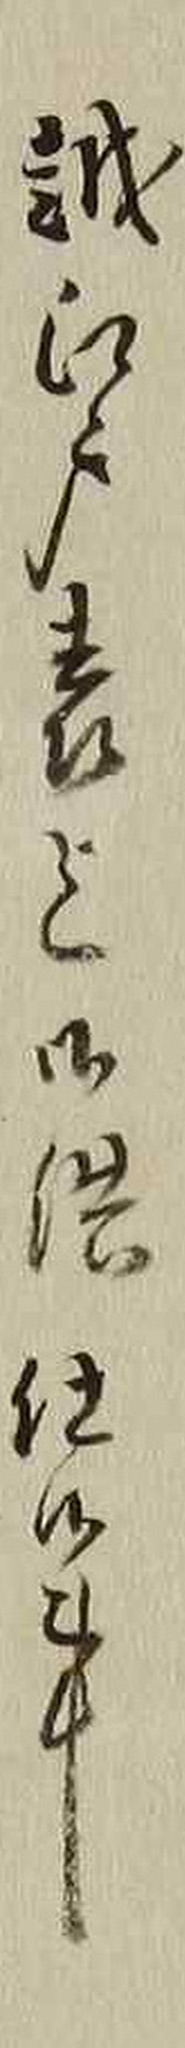越江戸表迄御供仕候事
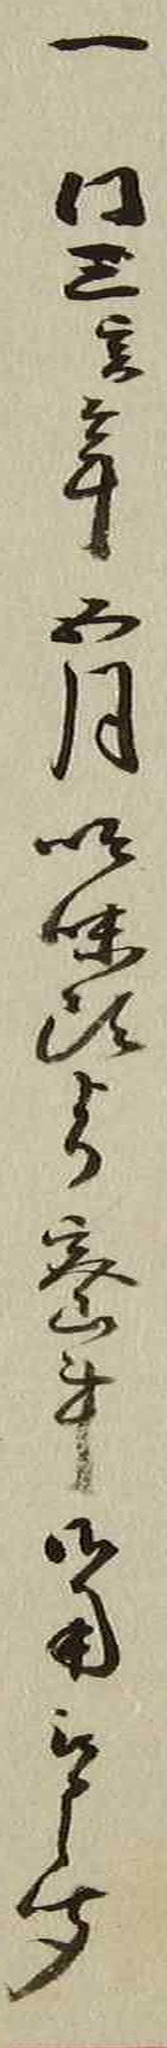一同三亥年五月吟味頭より密事御用被申聞
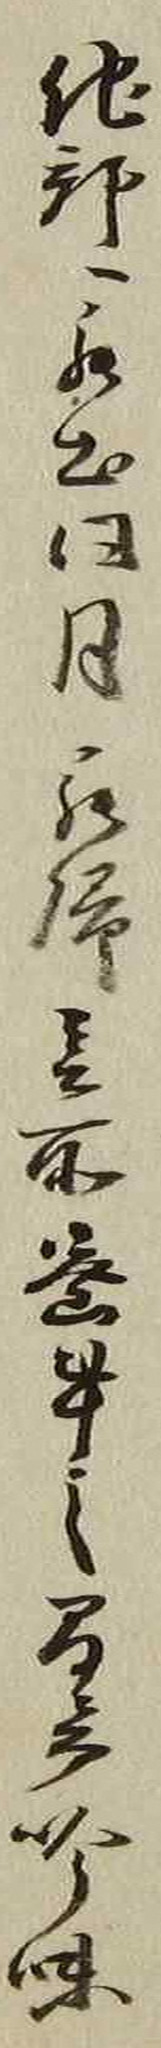他邦へ罷出同月罷帰其所密事之間ニ而吟味
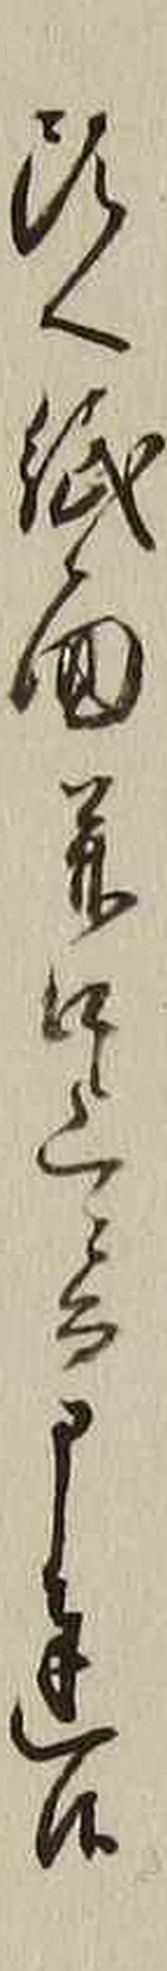頭へ紙面幷口上ニ而申達候
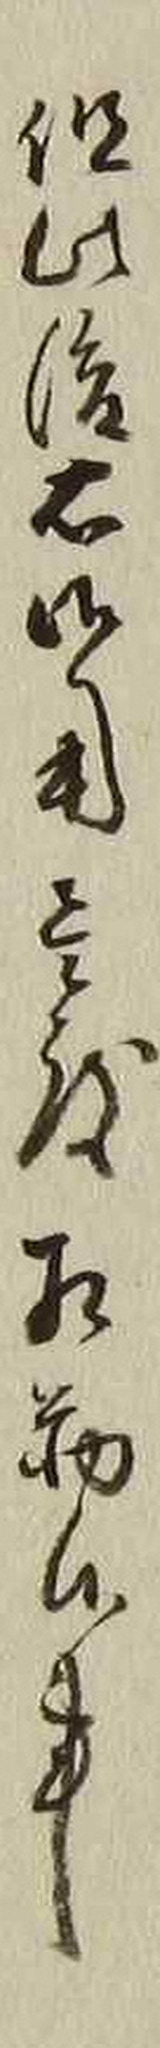但此後右御用壱度相勤候事
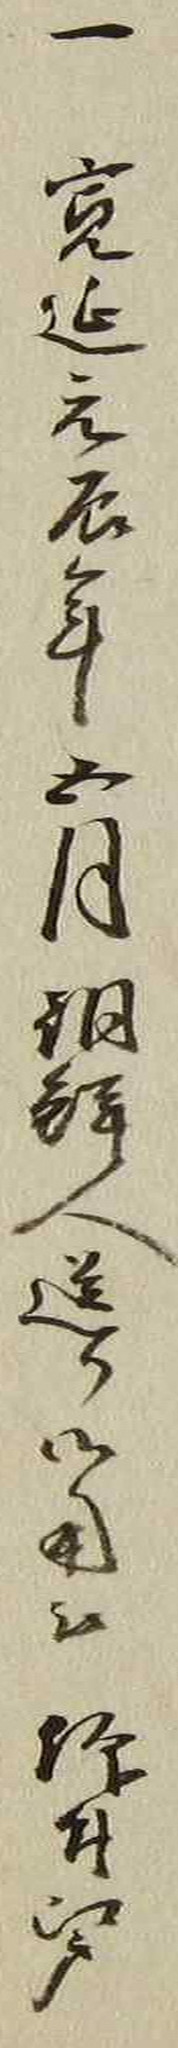一寛延元辰年五月朝鮮人送り御用被仰付江戸
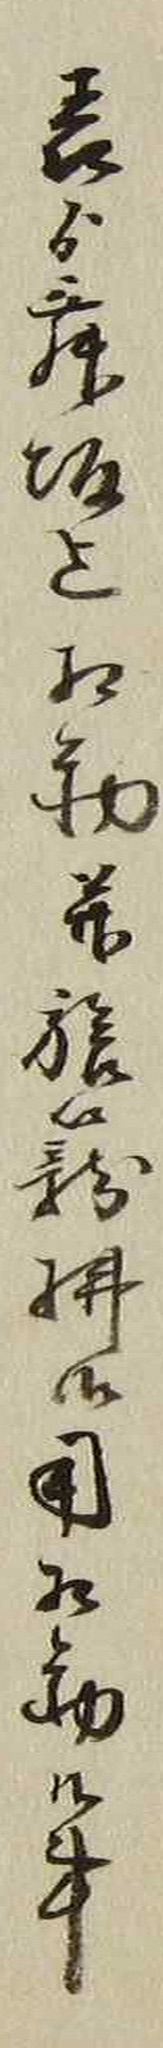表ゟ舞坂迄相勤幷旅籠払御用相勤候事
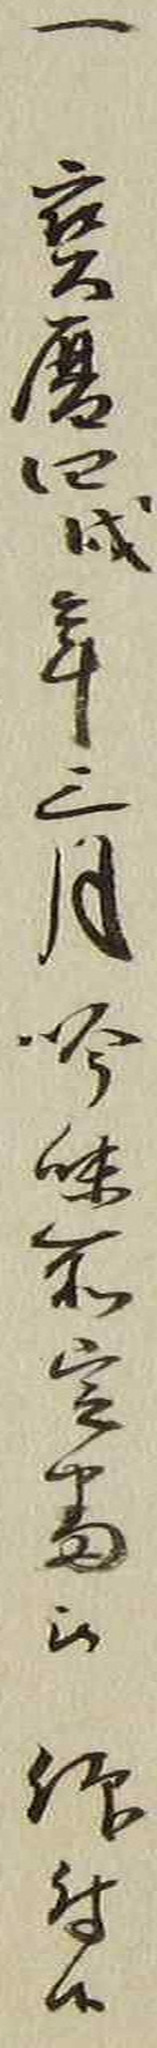一宝暦四戌年三月吟味所定番被仰付候
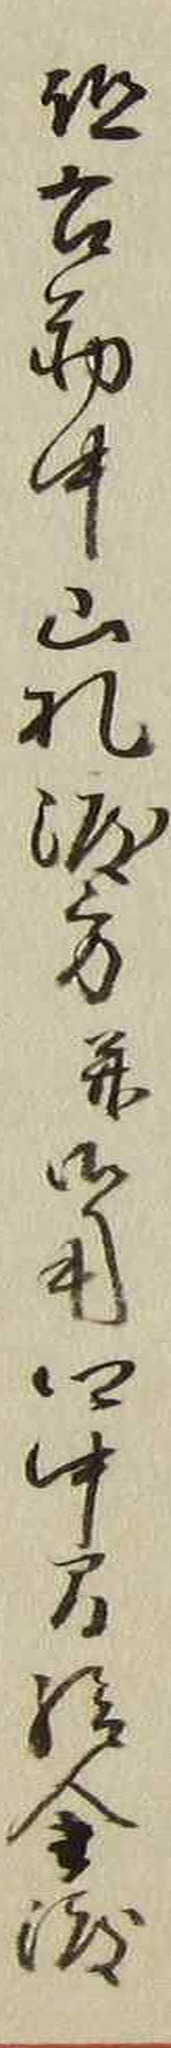但右勤中山札渡方并御用口中間給金渡
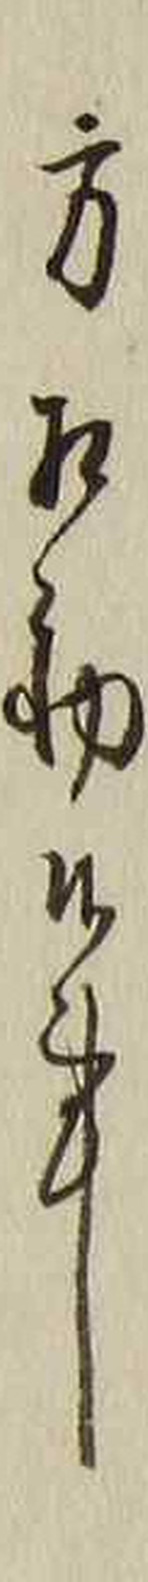方相勤候事

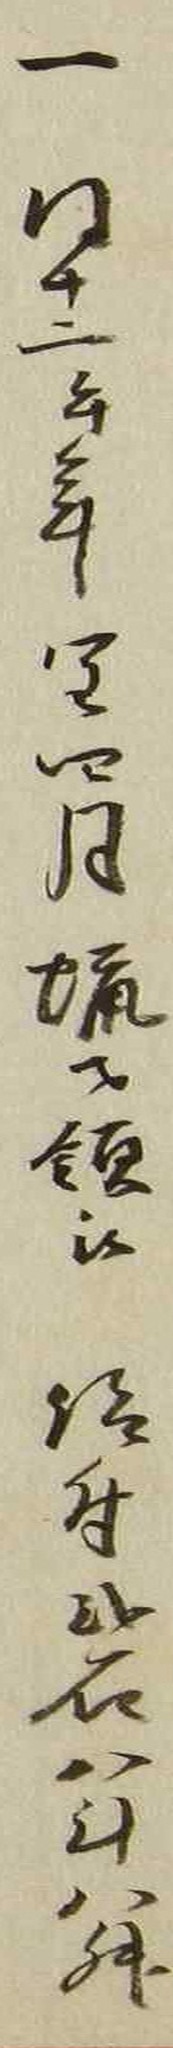一同十二午年閏四月蝋才領被仰付弐石八斗八升
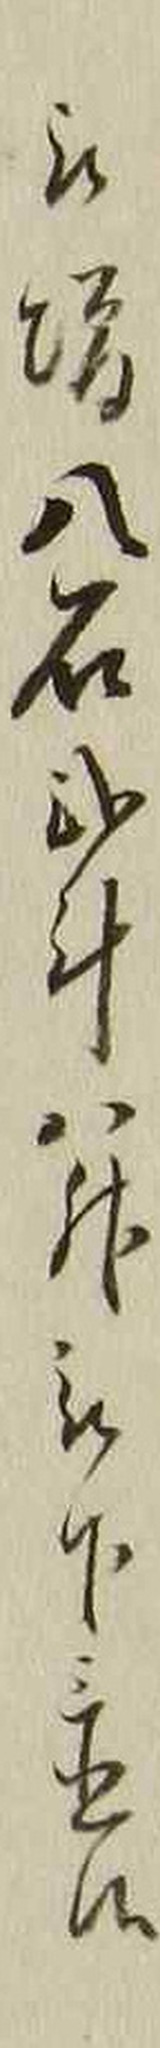被増八石弐斗八升被下置候
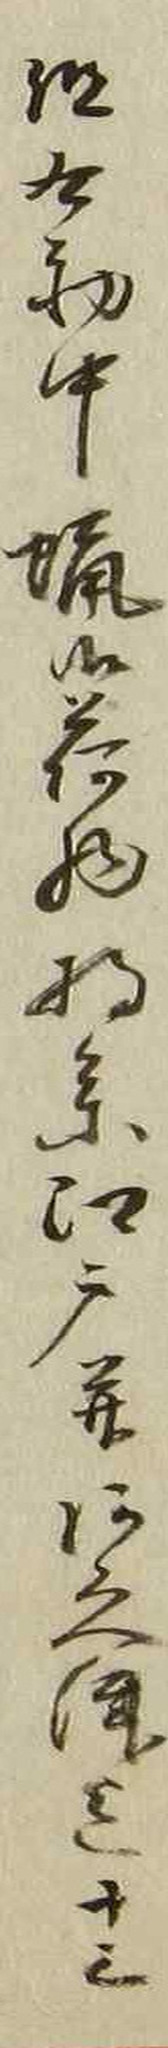但右勤中蝋御荷物持参江戸并阿久津迄十三
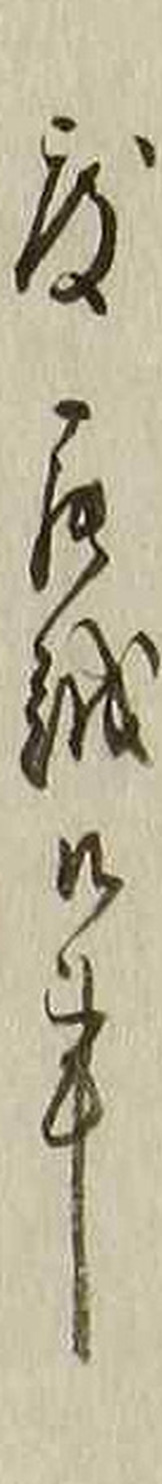度罷越候事
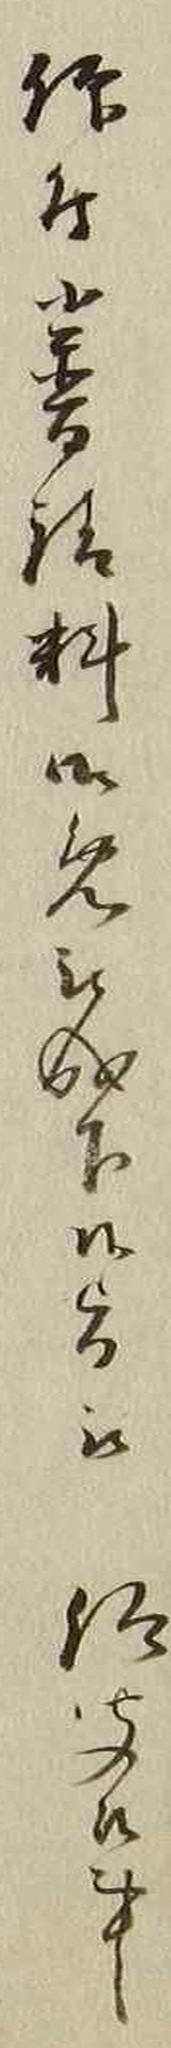仰付小普請料御免被成下候旨被仰聞候事
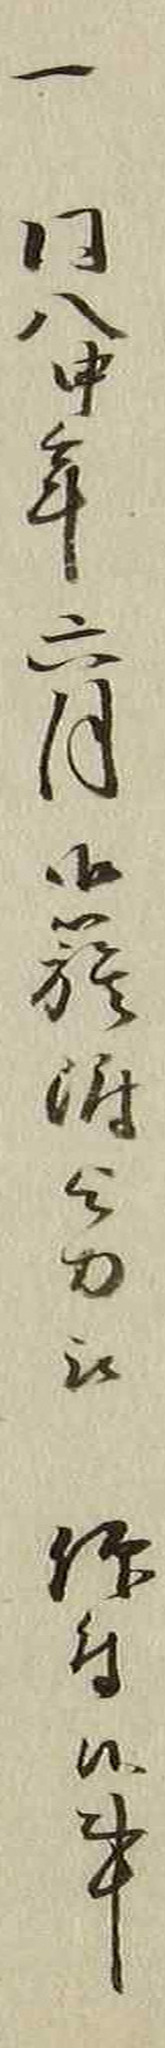一同八申年六月御籏附与力被仰付候事
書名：諸士系譜　巻之32　い之部32
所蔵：会津若松市立会津図書館
